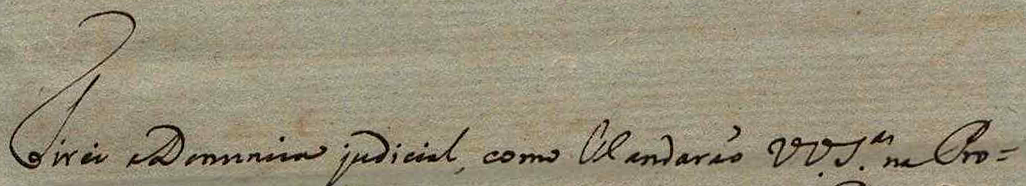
Tirei e Denuncia judicial, como Mandarão V V. S.as na Pro
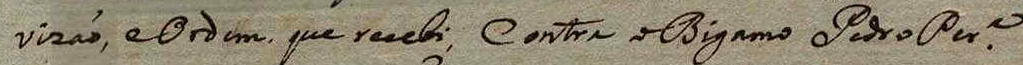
vizaõ, a Ordem que recebi; Contra o Bigamo Pedro Per.a
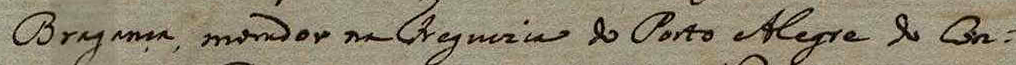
Bragança, morador na Freguezia do Porto Alegre do Con
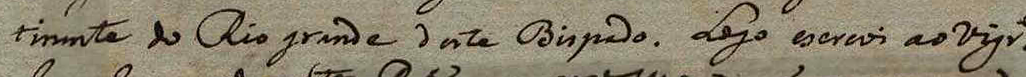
tinente do Rio grande deste Bispado. Logo escrevi ao Vigr.o
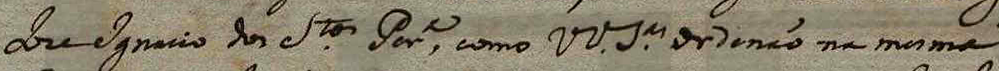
Ioze Ignacio dos S.tos Per.a, como V V. S.as ordenaõ na mesma
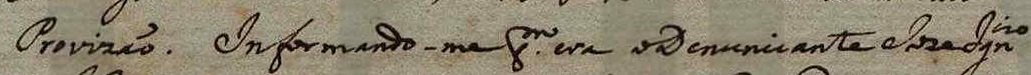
Provizaõ. Informando-me q.m era o Denunciante Ioze Ign.cio
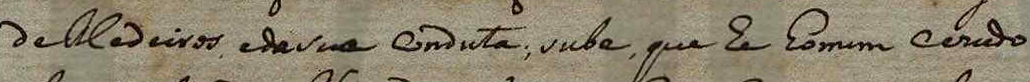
de Medeiros e da sua conduta; sube, que he homem cezudo
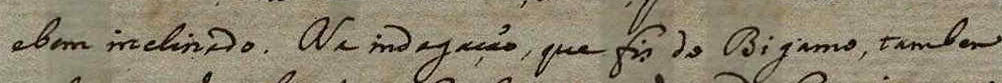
e bem inclinado. Na indagaçaõ, que fis do Bigamo, tambem
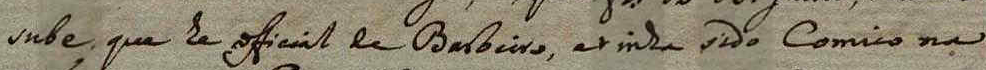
sube, que he official de Barbeiro, e tinha sido Comico na
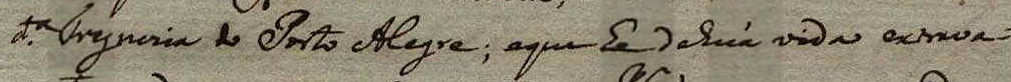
d̄.a Freguezia do Porto Alegre; e que he de huā vida extrava
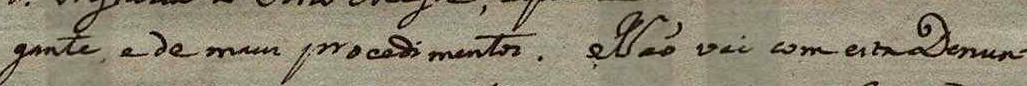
gante, e de mau procedimentos. Naõ vai com esta Denun
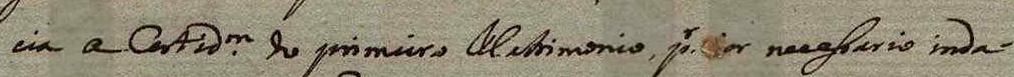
cia a Certid.m do primeiro Matrimonio, p.r _er necessario inda
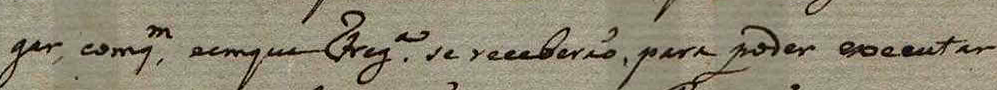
gar, com q.m, e em que Freg.a se receberaõ, para poder executar
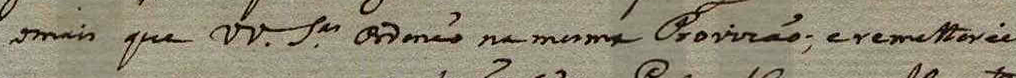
o mais que V V. S.as ordenaõ na mesma Provizaõ; e remetterei
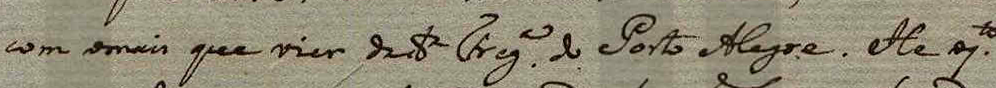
com o mais que vier da d̄a Freg.a do Porto Alegre. He o q.to
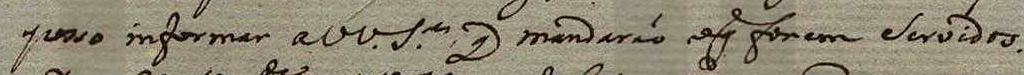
posso informar a V V. S.as q̄ mandaraõ e q̄ forem servidos.
